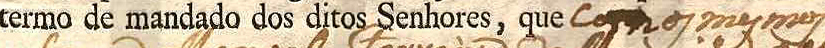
termo de mandado dos ditos Senhores, que com os mesmos
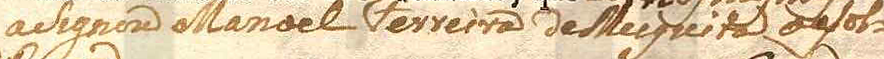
aSignou Manoel Ferreira de Mesquita o sob
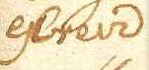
esCrevi
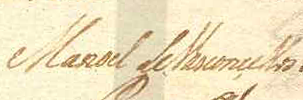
Manoel de Vasconçellos
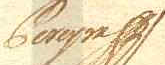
Pereyra
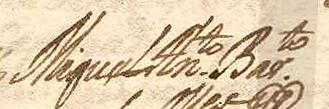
Miguel An.to Bar.to
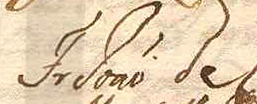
Fr Ioaõ de
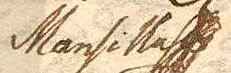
Μansilha
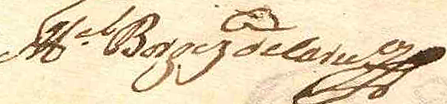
M.el Borges de Caruo
